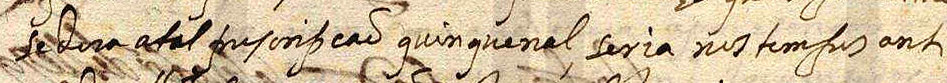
se dera a tal prescripçaõ quinquenal, seria nos tempos anti
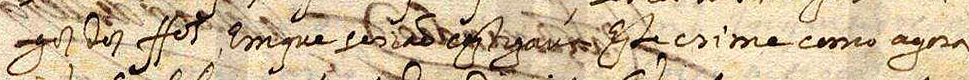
gos dos ffos, Em que se não castigaua Este crime como agora
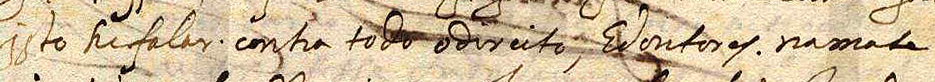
jsto he falar contra todo o direito, E doutores na mate
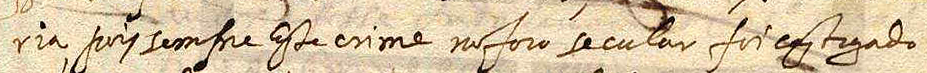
ria, pois sempre Este crime no foro secular foi castigado
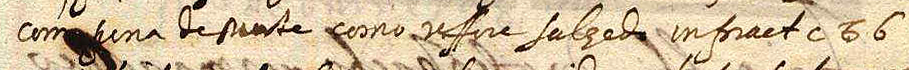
com pena de morte como se ffose julgado in pract c 86
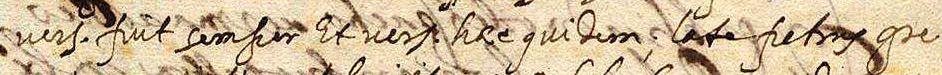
uers. fuit semper Et uerse hæc quidem late petrus gre
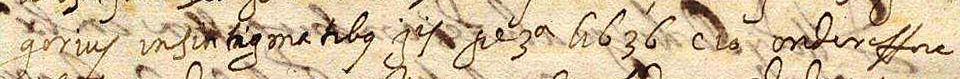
gorius in sintagma tibꝯ jis peza lib 36 c 10 onde reffere
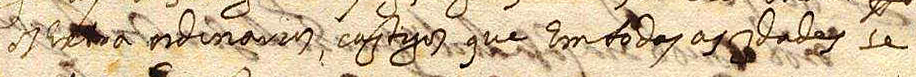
os Extraordinarios, castigos que Em todas as idades se
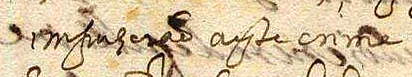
impuseraõ a este crime
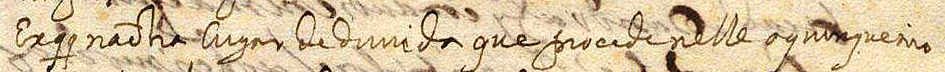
Exꝗꝗ naõ ha lugar de duuida que procede nelle o quinquenio
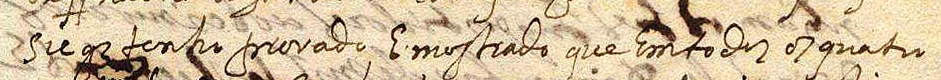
sic qꝫ tenho provado, E mostrado que em todos os quatro
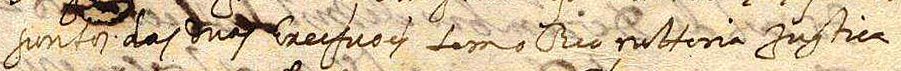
juntos das duas Excepçoẽs tem o Reo nottoria Justiça
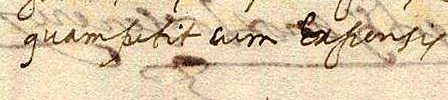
quam petit cum Expensis
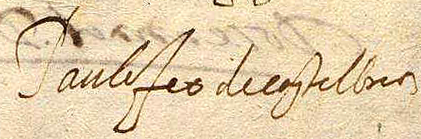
Paulo feo de castel brco
